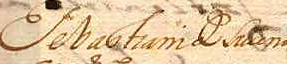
Sebastiam de Lucena.
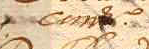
p conh.o
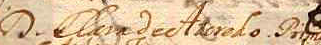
D. Clara de Azeredo. Prima.
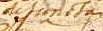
e defuncta
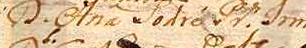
D. Ana Sodré Pr.a Irm.
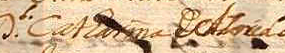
D. Catharina de Azeredo
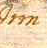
Irm.
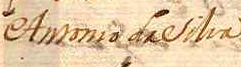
Antonio da Silva.
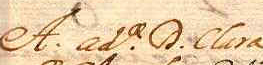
A. a d.a D. Clara
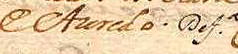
e Azeredo. Def.a
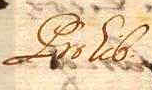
Prohib.
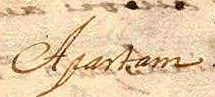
Apartam.
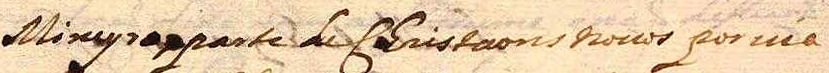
Mineyro, parte de Christaons nouos por uia
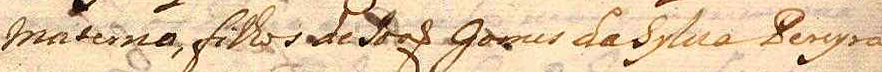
materna, filhos de Joaõ Gomes da Sylua Pereyra
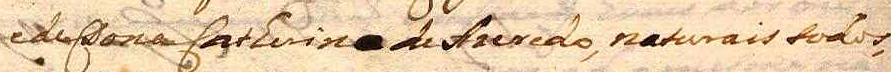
e de Dona Catherina de Azeredo, naturais todos,
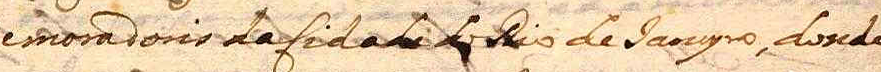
e moradoris da Cidade do Rio de Janeyro, donde
